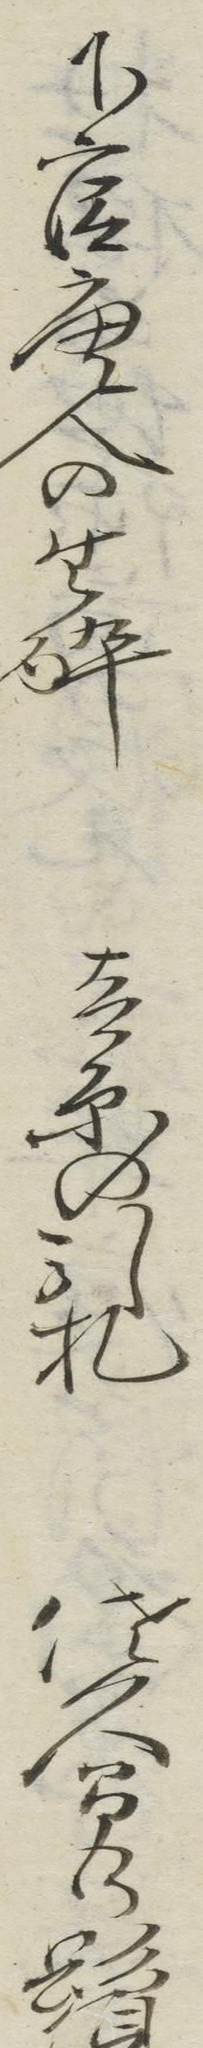下官唐人之生酔吉原の引札佐久間の鬚
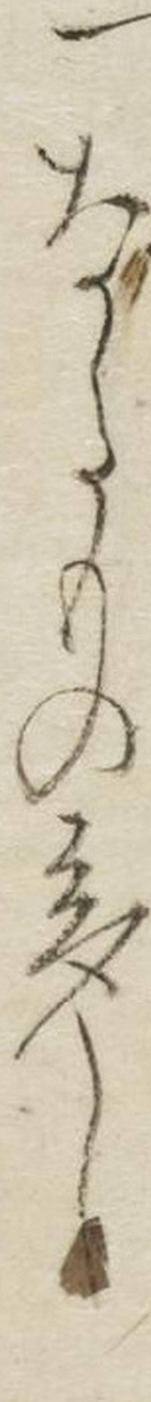なるもの多し
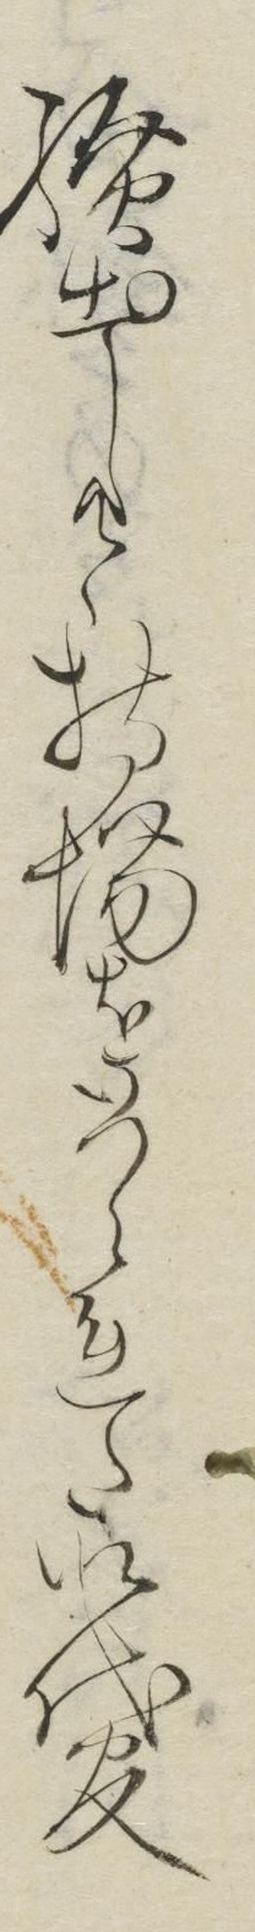騒出し候持場をいつゝれた御代官
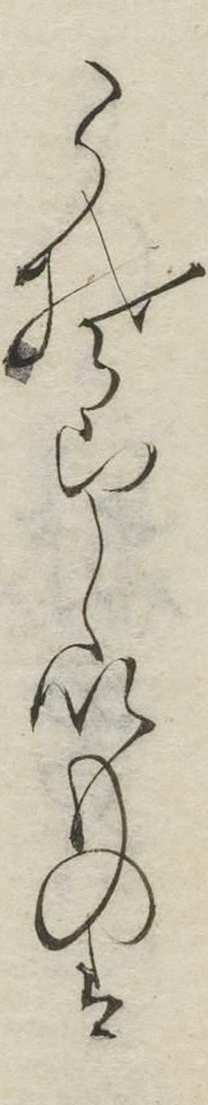うそやましいものは
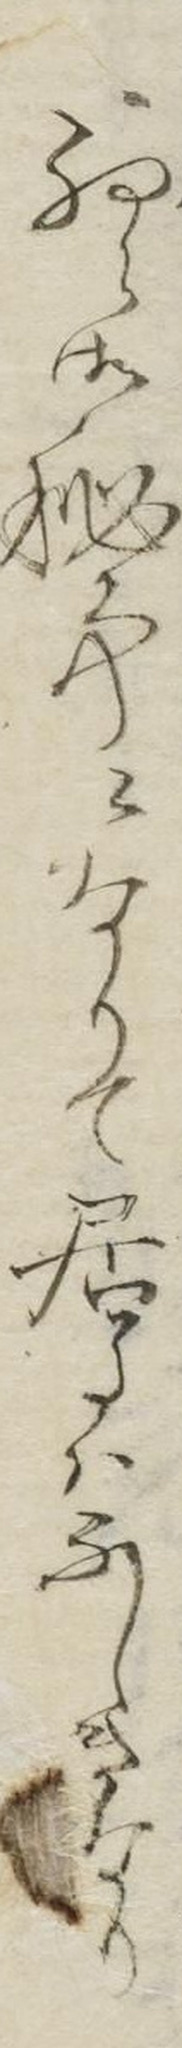約〻御秘事ニなりて居るハふしきなり
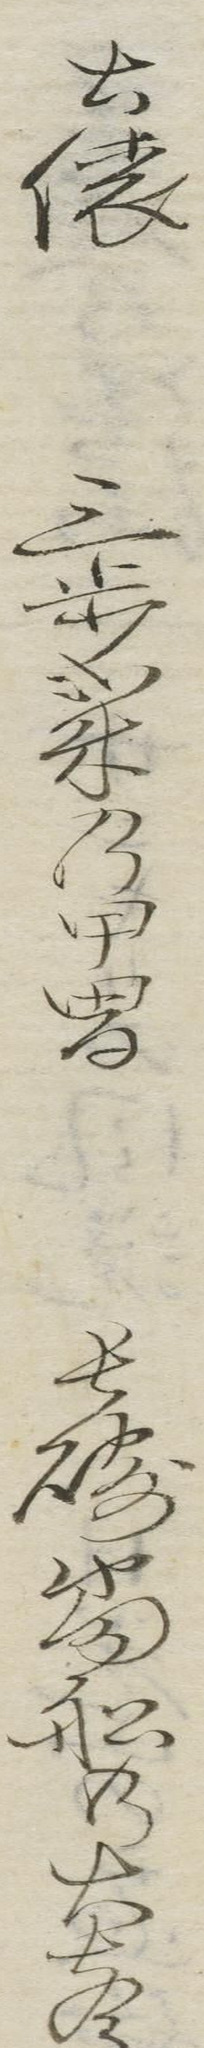土俵三歩弐朱の甲冑長﨑番船の大聲
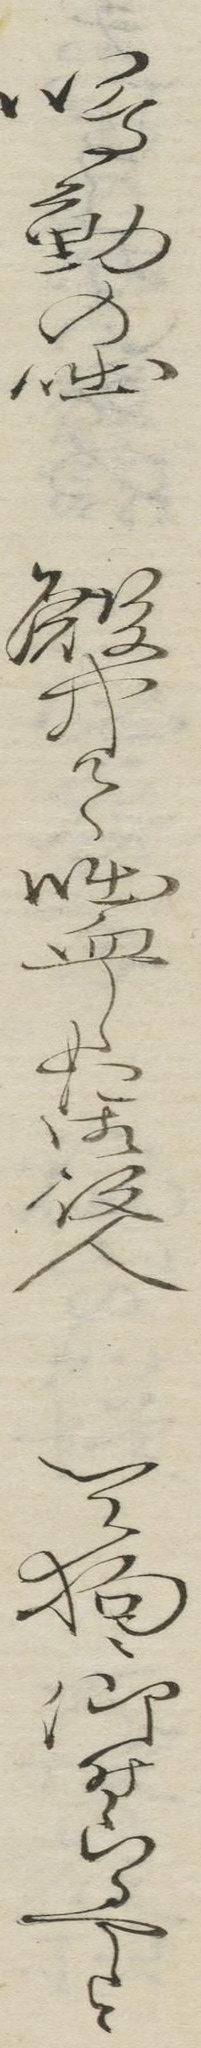鳴動の咄殿中て咄血した御役人天狗ニ仰付らるへしと
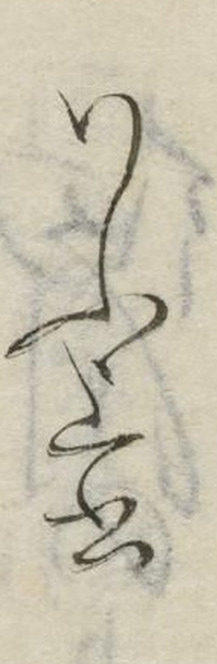いふ上書
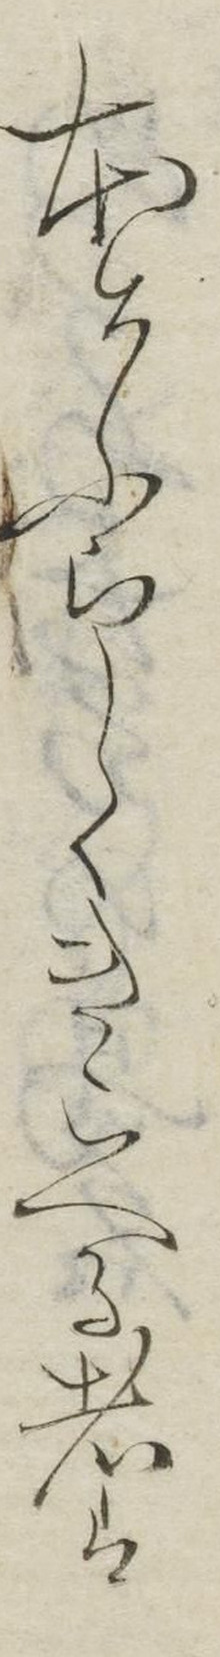本たふらしくきこへる者は
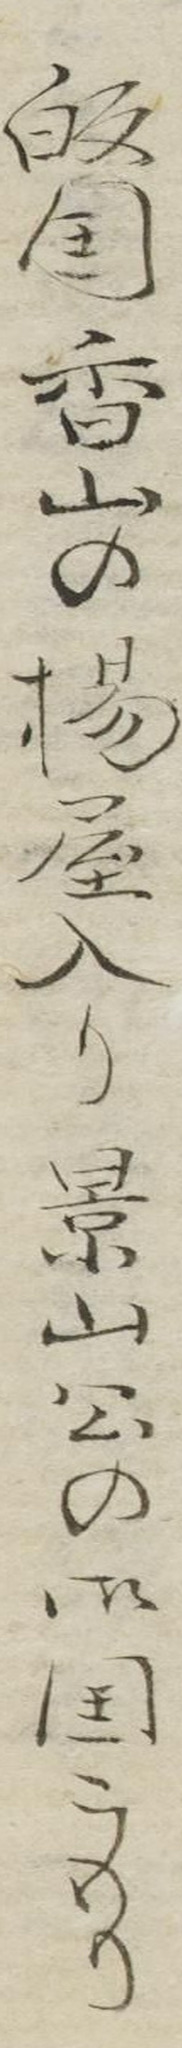帰国香山の揚屋入り景山公の御国こもり

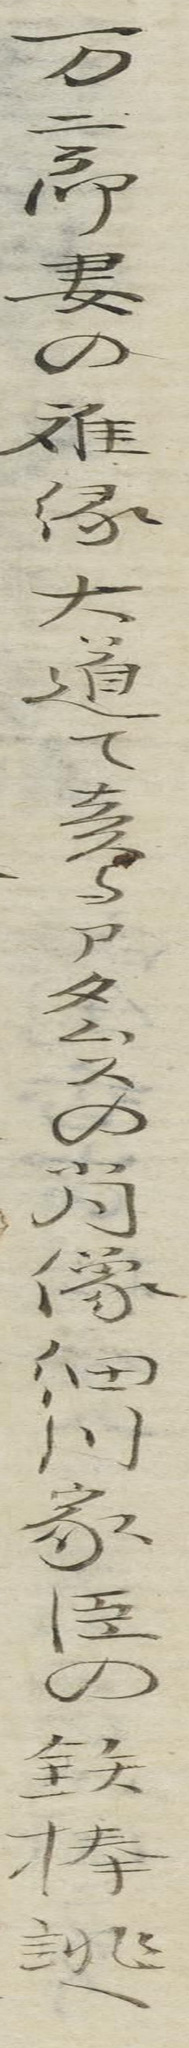万二郎妻の難縁大道て売るアタムスの肖像細川家臣の鉄棒誂へ
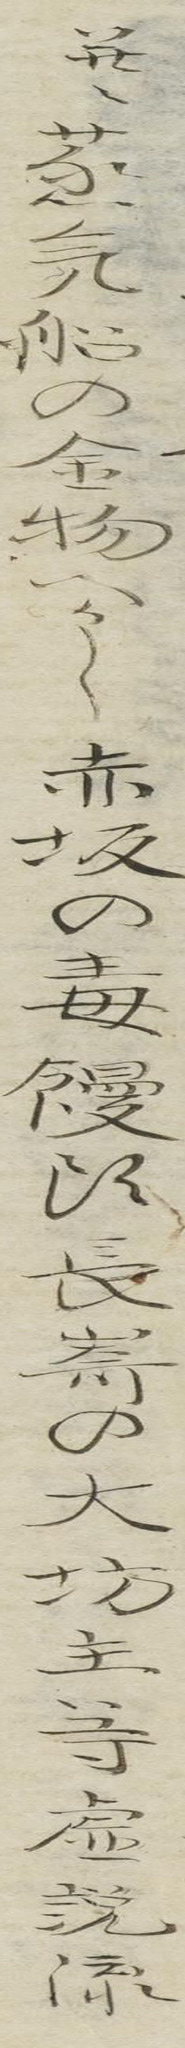幷ニ蒸気船の金物へらし赤坂の毒饅頭長崎の大坊主等虚説流
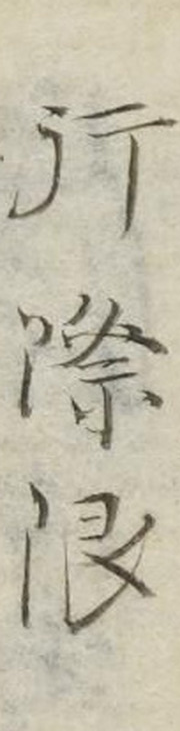行際限
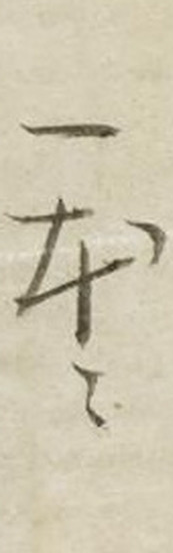一本ニ
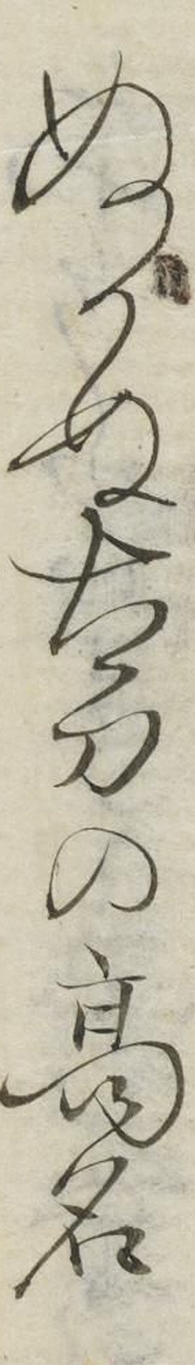ぬかぬ太刀の高名
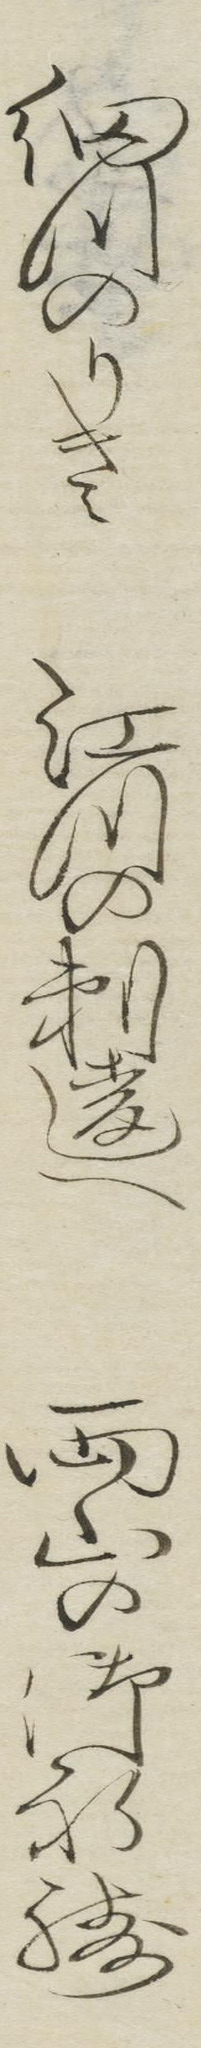細川のりきミ江川の刺違へ両山の御祈祷
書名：大地震實録
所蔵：東京大学地震研究所図書室 Earthquake Research Institute Library, The University of Tokyo, JAPAN
